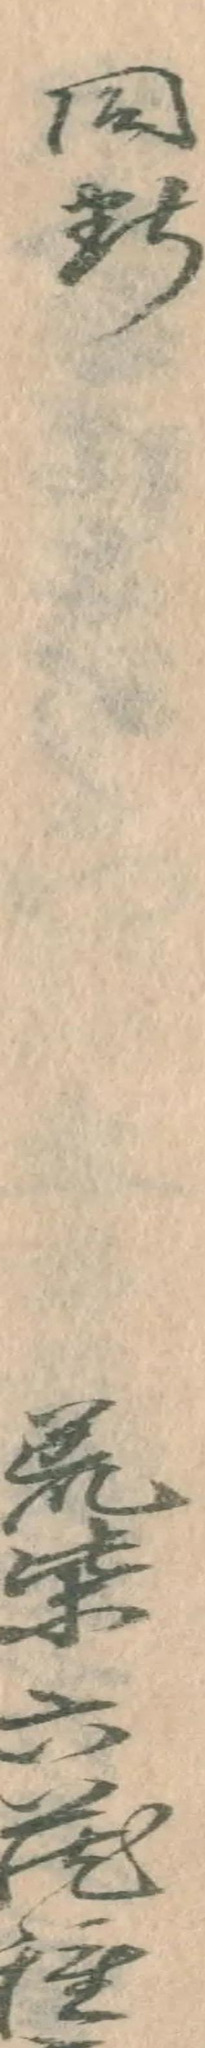同断荒柴六蔵種重
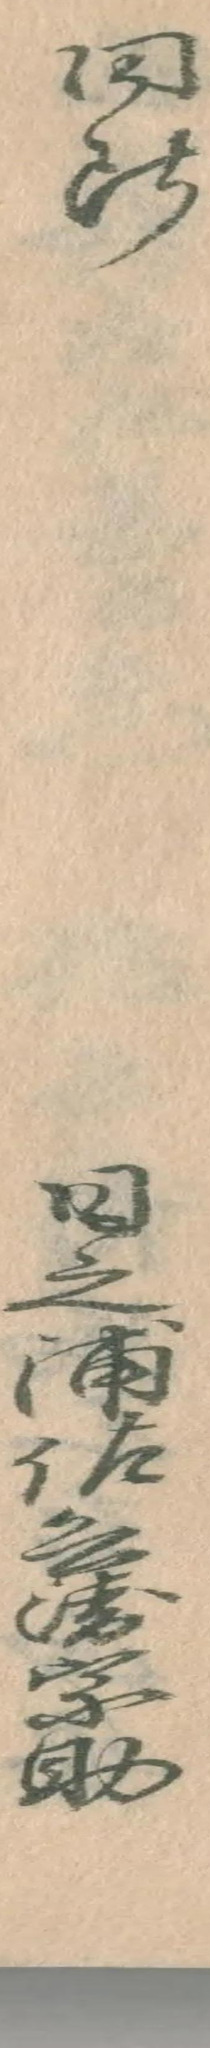同断日之浦佐兵衛宗助

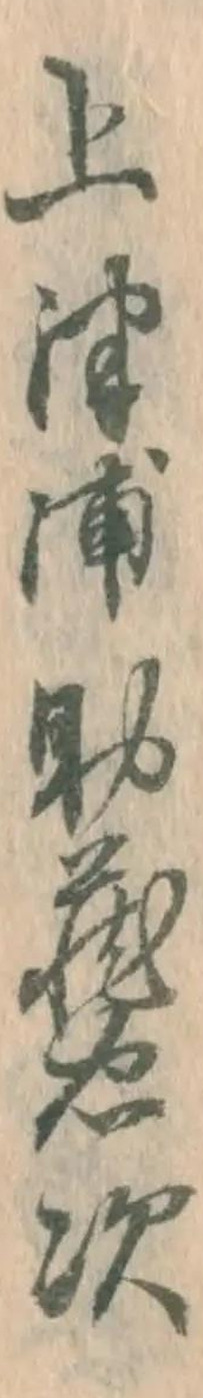上津浦助蔵忠次
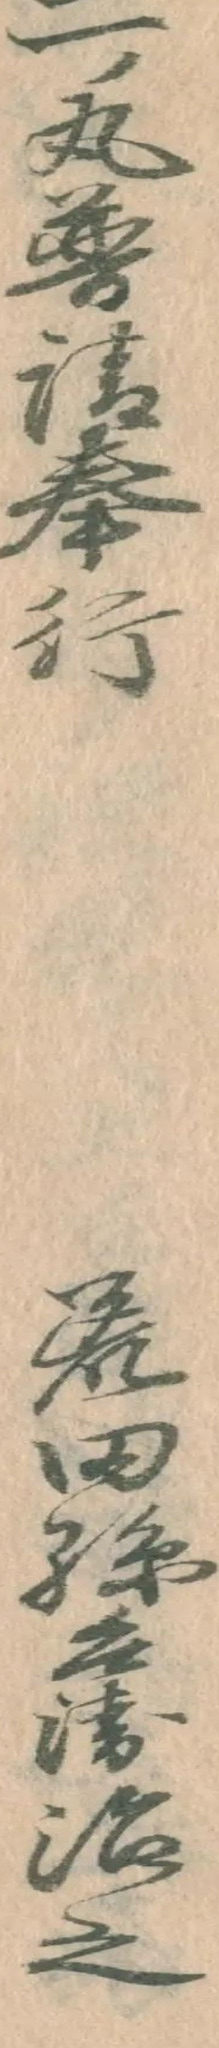二之丸普請奉行荒田孫兵衛治之
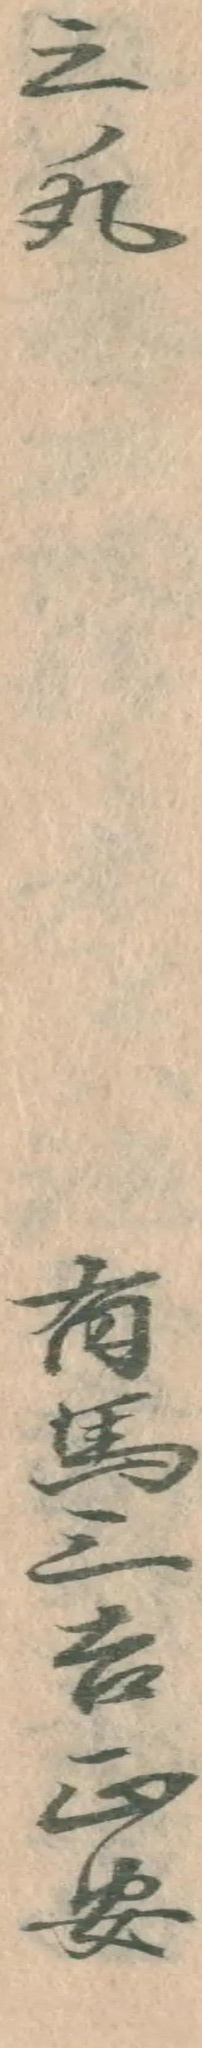三之丸有馬三吉正安
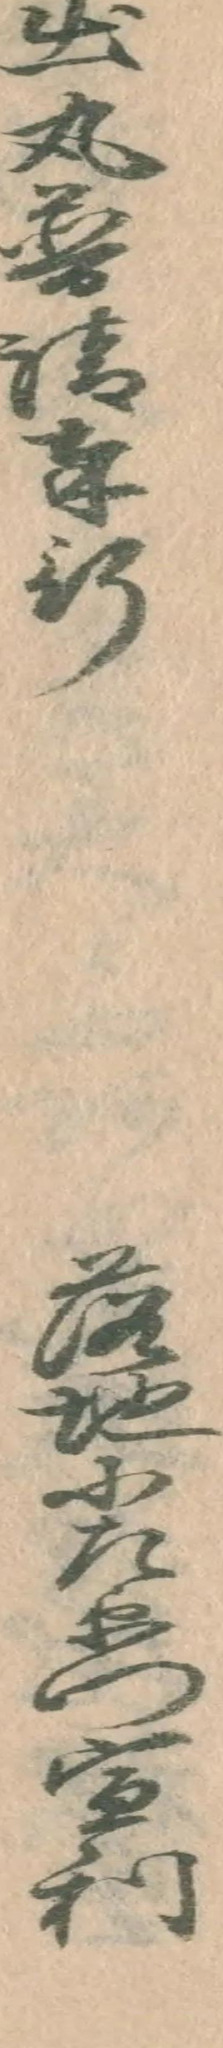出丸普請奉行落地小左衛門宣利
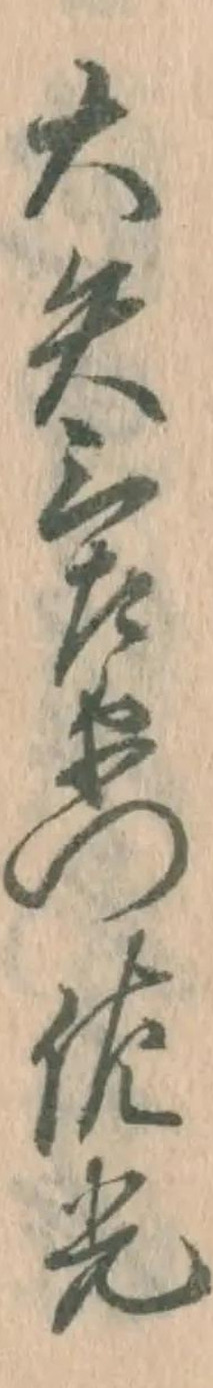大矢三左衛門佐光
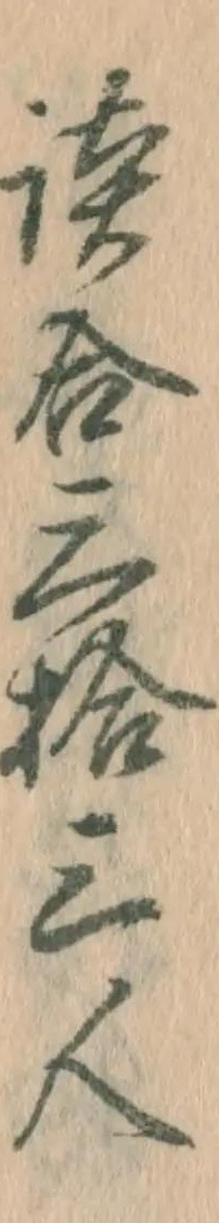談合三拾三人
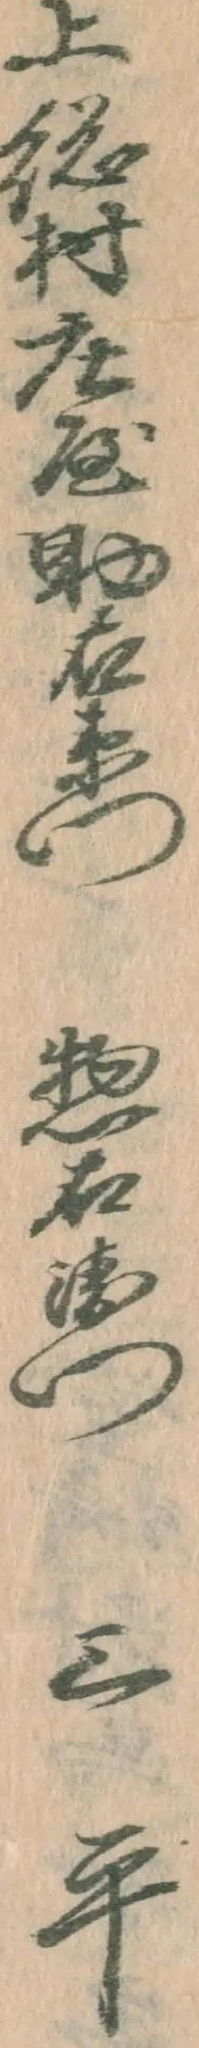上総村庄屋助右衛門惣右衛門三平
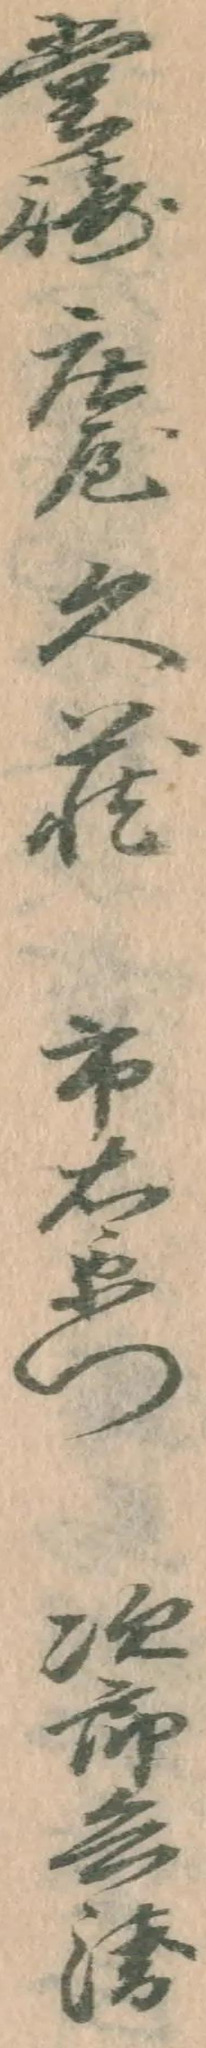堂崎庄屋久蔵市右衛門次郎兵衛
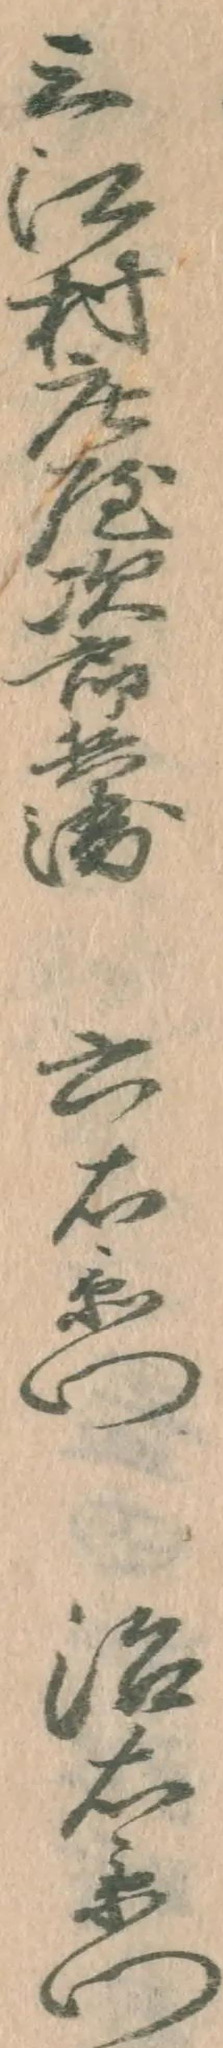三江村庄屋次郎兵衛六右衛門治右衛門
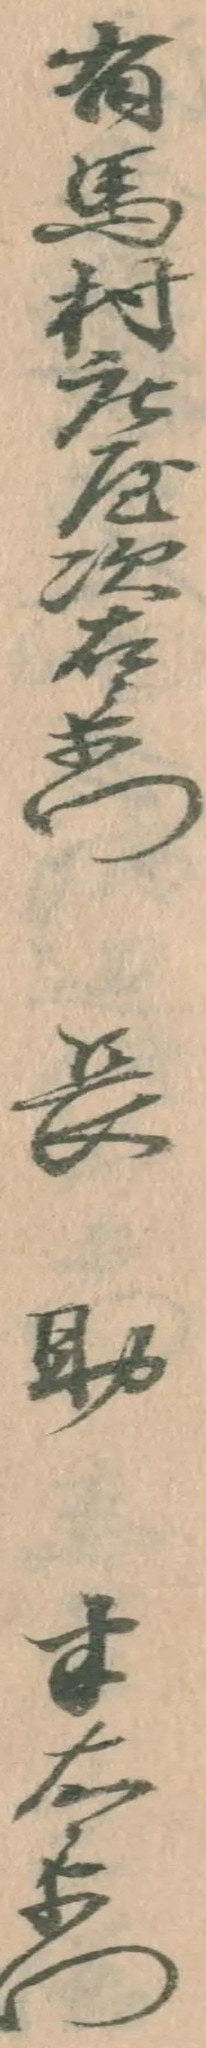有馬村庄屋次右衛門長助半右衛門
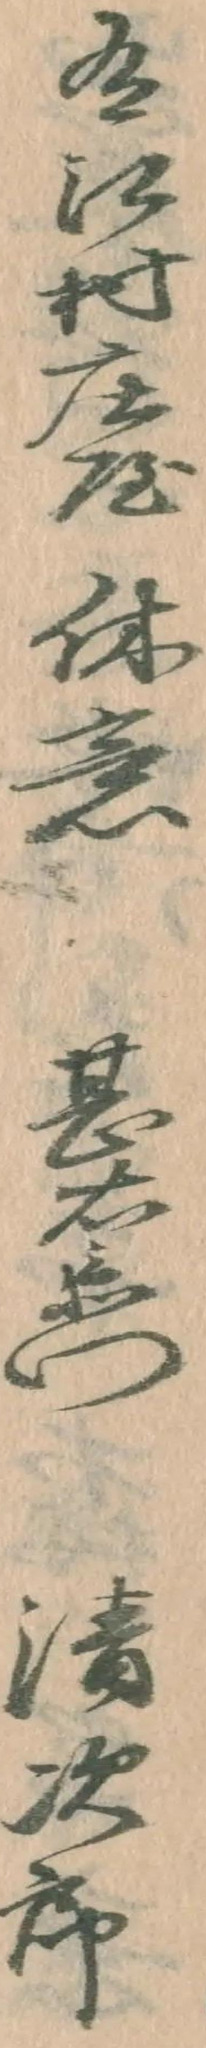有江村庄屋休意甚右衛門清次郎
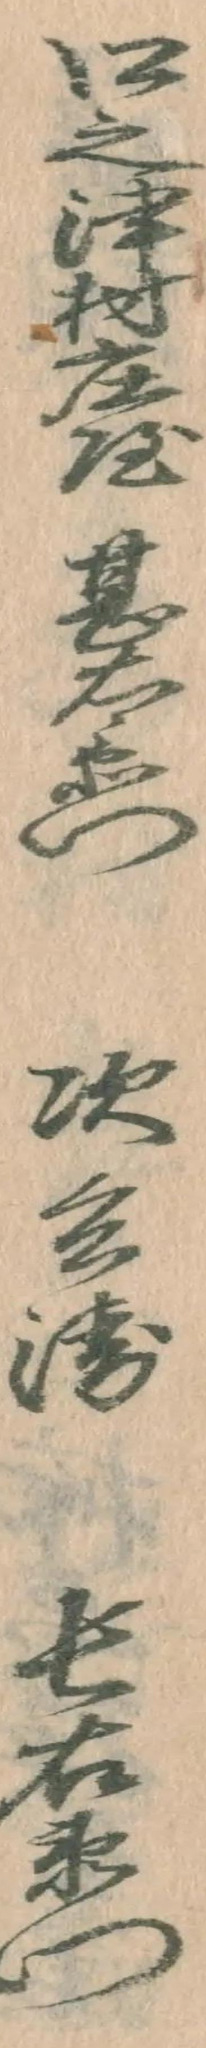口之津村庄屋甚右衛門次兵衛長右衛門
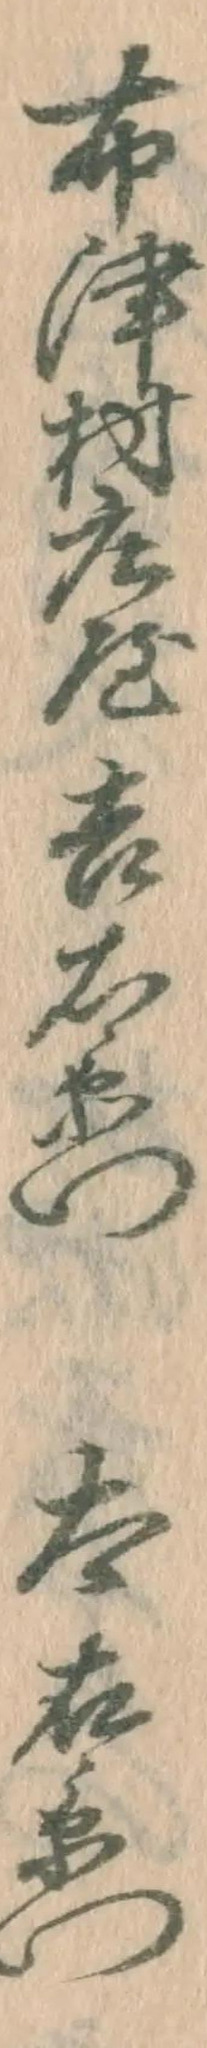布津村庄屋吉右衛門太右衛門
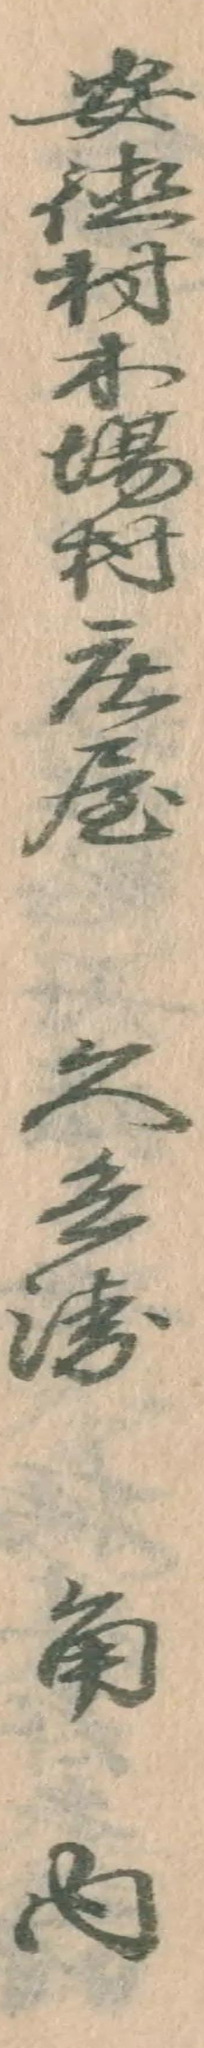安徳村木場村庄屋久兵衛角内
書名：切支丹御退治記 49巻. [4]
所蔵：国立国会図書館 National Diet Library, JAPAN
